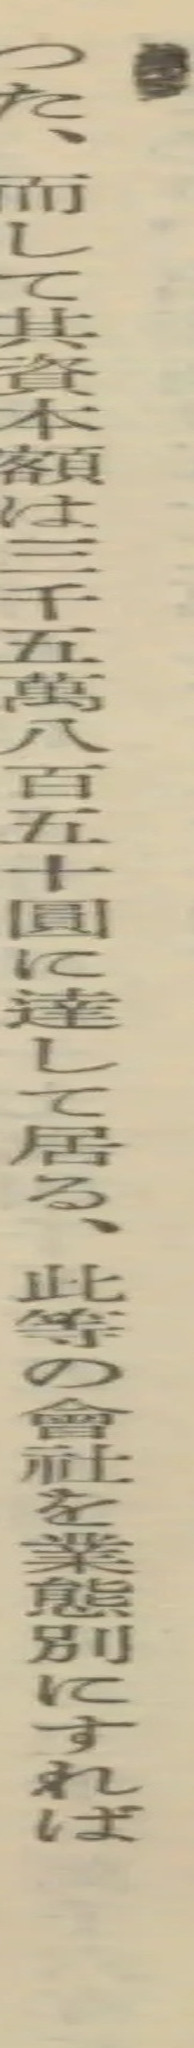つた、而して其資本額は三千五万八百五十円に達して居る、此等の会社を業態別にすれば
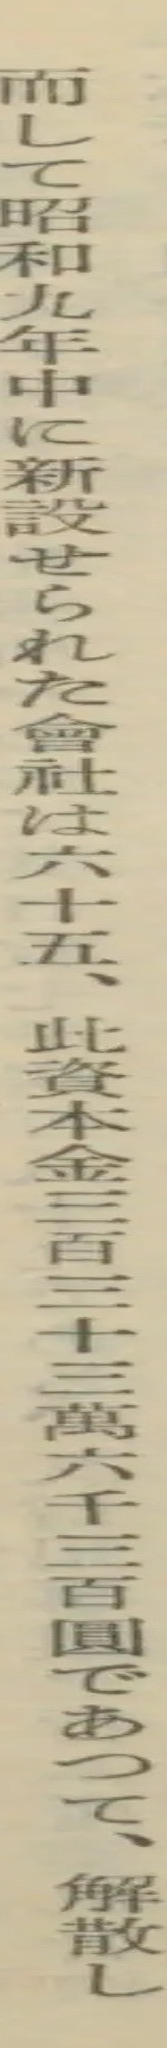而して昭和九年中に新設せられた会社は六十五、此資本金三百三十三万六千三百円であつて、解散し
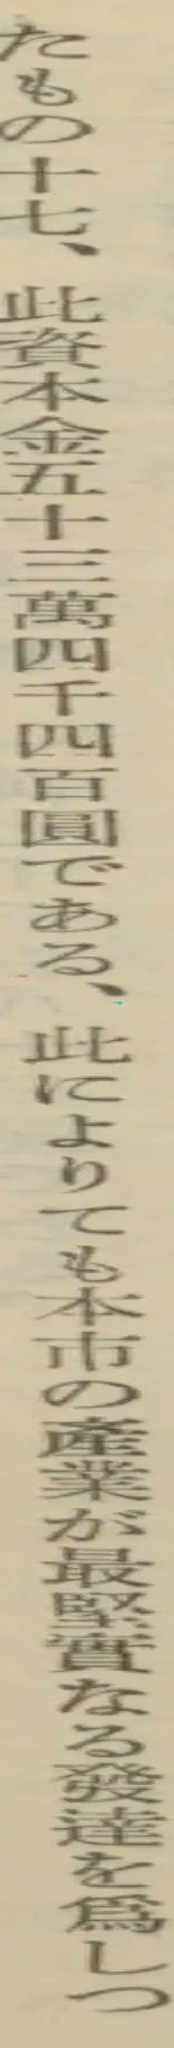たもの十七、此資本金五十三万四千四百円である、此によりても本市の産業が最堅実なる発達を為しつ
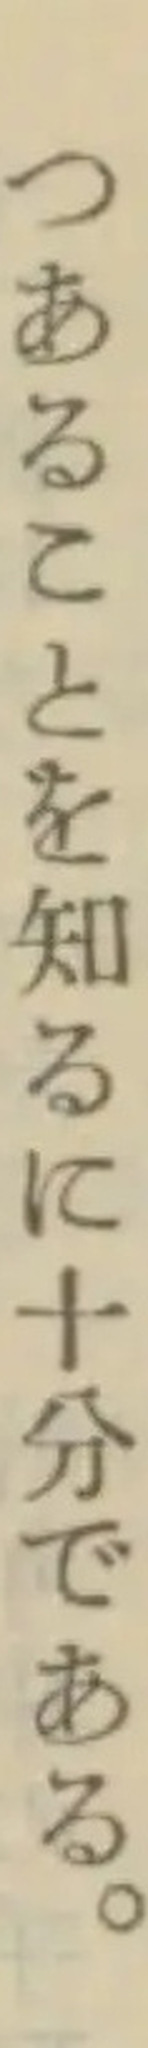つあることを知るに十分である。
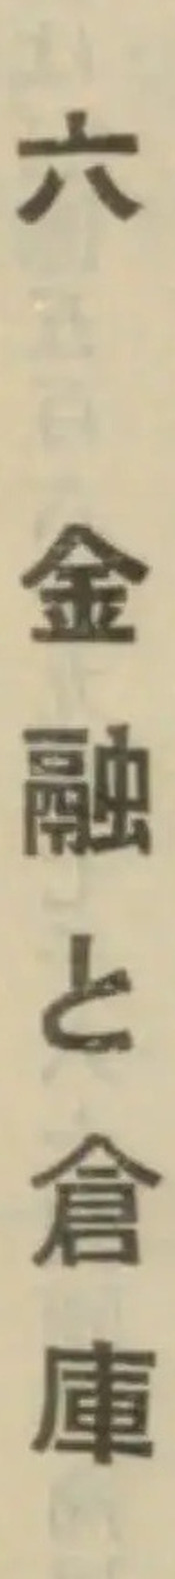六金融と倉庫

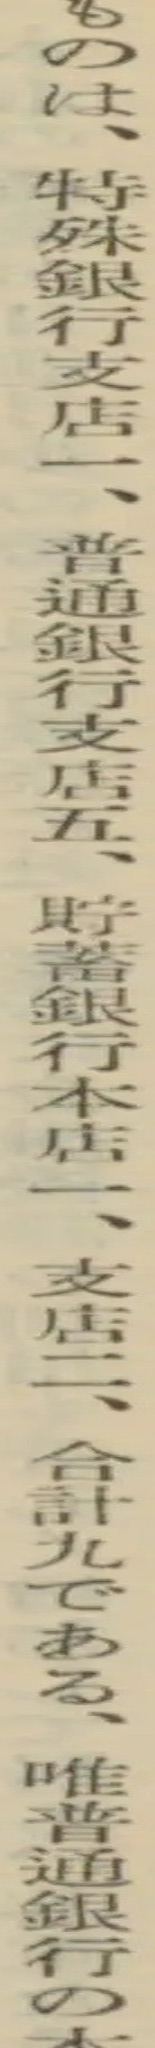ものは、特殊銀行支店一、普通銀行支店五、貯蓄銀行本店一、支店二、合計九である、唯普通銀行の本
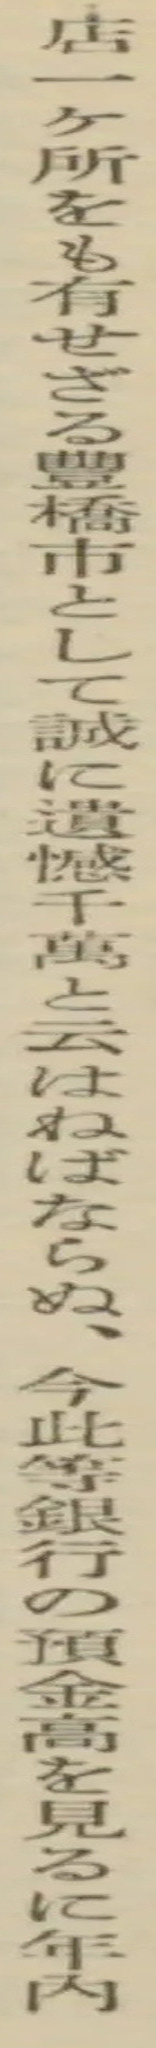店一ヶ所をも有せざる豊橋市として誠に遺憾千万と云はねばならぬ、今此等銀行の預金高を見るに年内
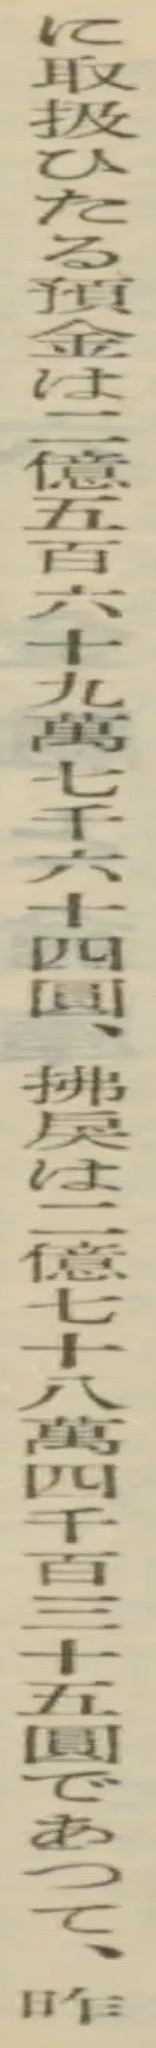に取扱ひたる預金は二億五百六十九万七千六十四円、払戻は二億七十八万四千百三十五円であつて、昨
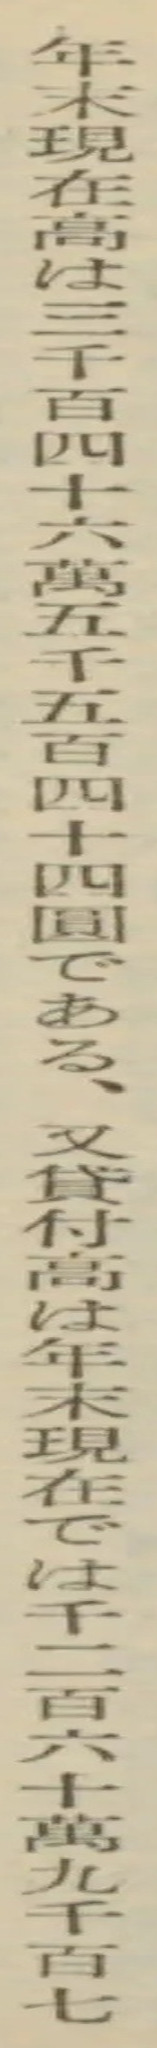年末現在高は三千百四十六万五千五百四十四円である、又貸付高は年末現在では千二百六十万九千百七
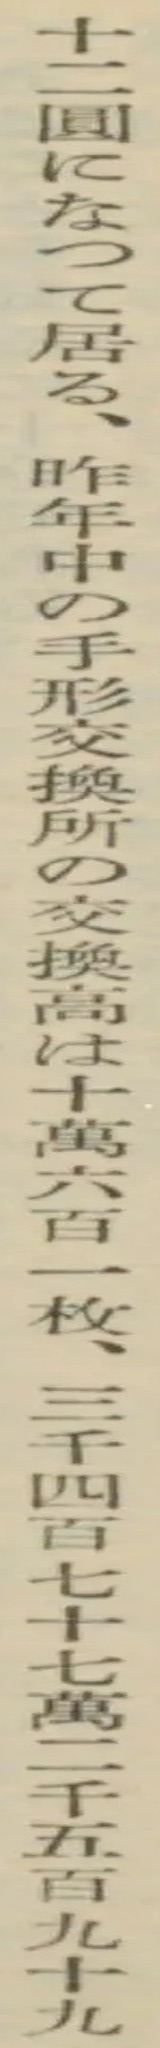十二円になつて居る、昨年中の手形交換所の交換高は十万六百一枚、三千四百七十七万二千五百九十九
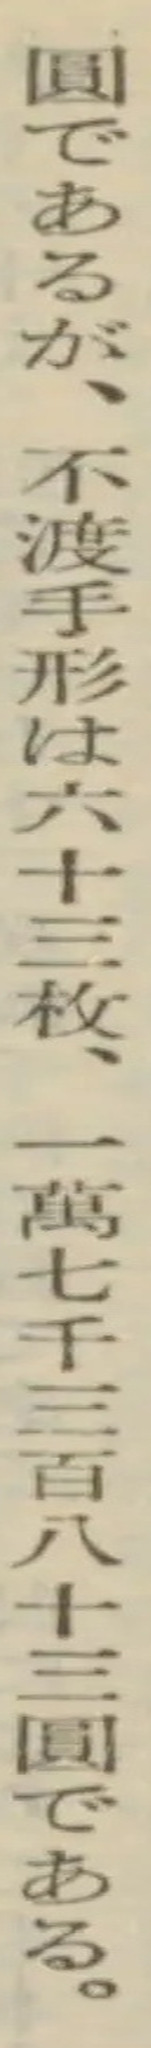円であるが、不渡手形は六十三枚、一万七千三百八十三円である。
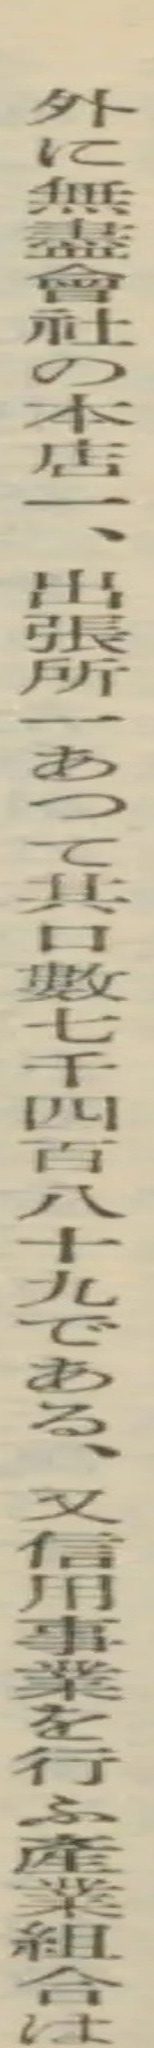外に無尽会社の本店一、出張所一あつて其口数七千四百八十九である、又信用事業を行ふ産業組合は
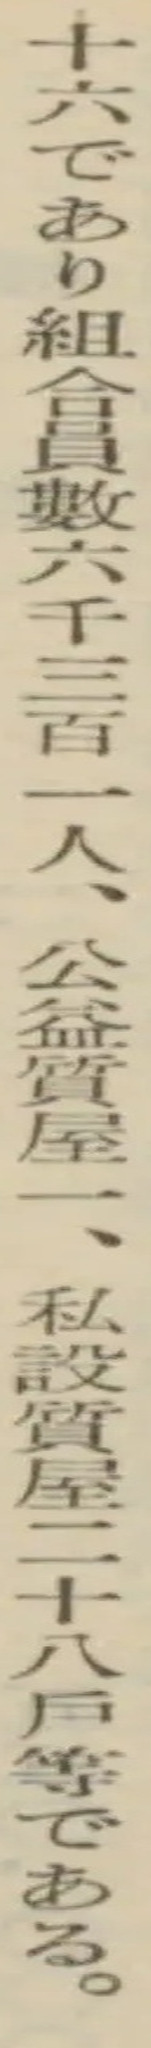十六であり組合員数六千三百一人、公益質屋一、私設質屋二十八戸等である。
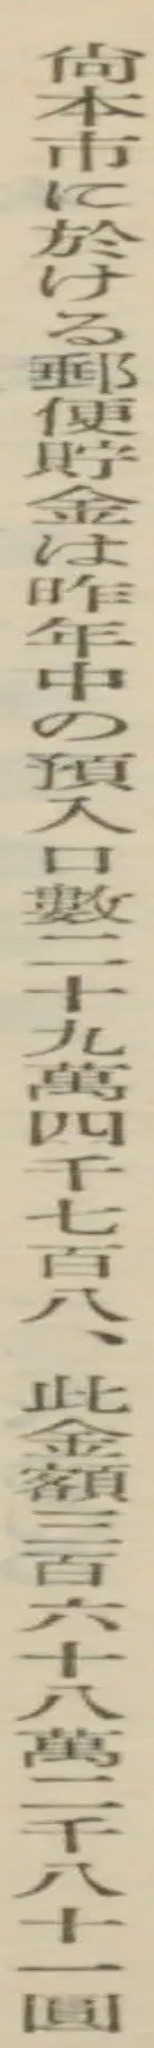尚本市に於ける郵便貯金は昨年中の預入口数二十九万四千七百八、此金額三百六十八万二千八十一円
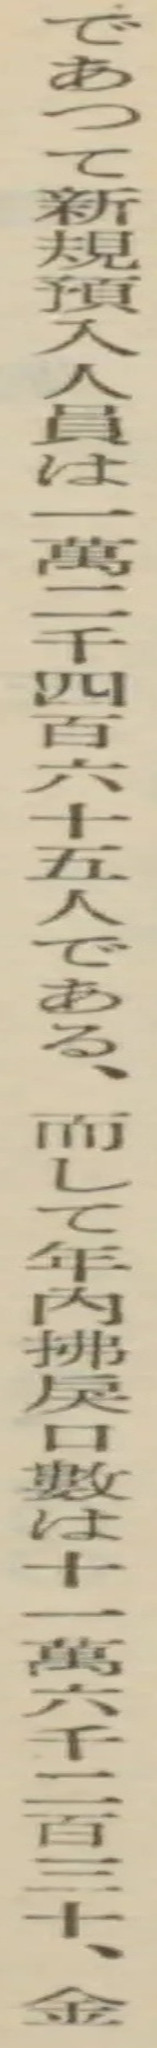であつて新規預入人員は一万二千四百六十五人である、而して年内払戻口数は十一万六千二百三十、金
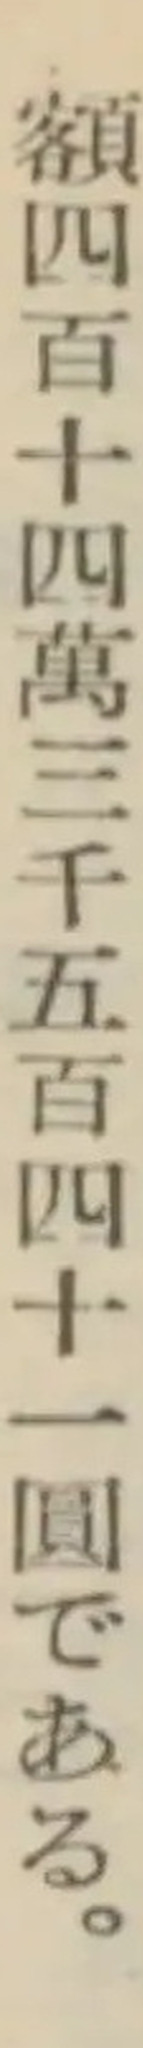額四百十四万三千五百四十一円である。
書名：産業の豊橋
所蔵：国立国会図書館 National Diet Library, JAPAN
